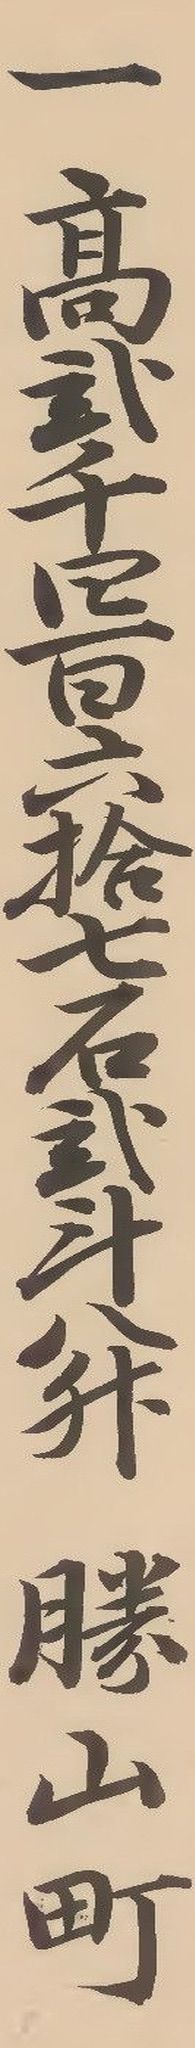一高弐千四百六拾七石弐斗八升勝山町
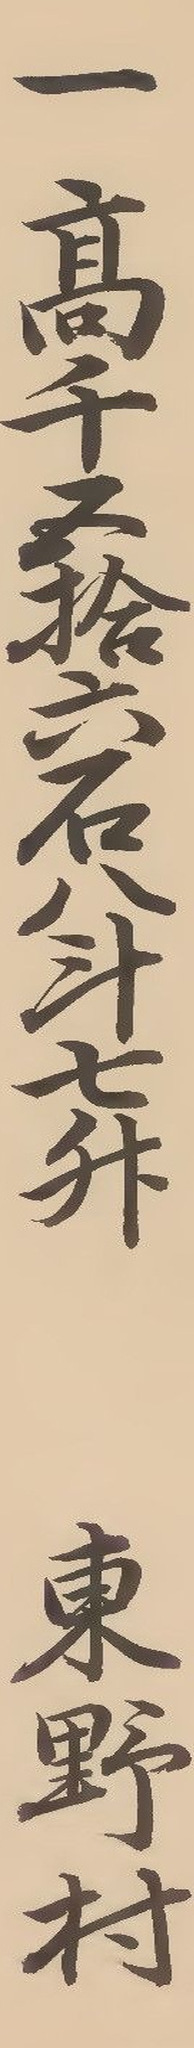一高千五拾六石八斗七升東野村
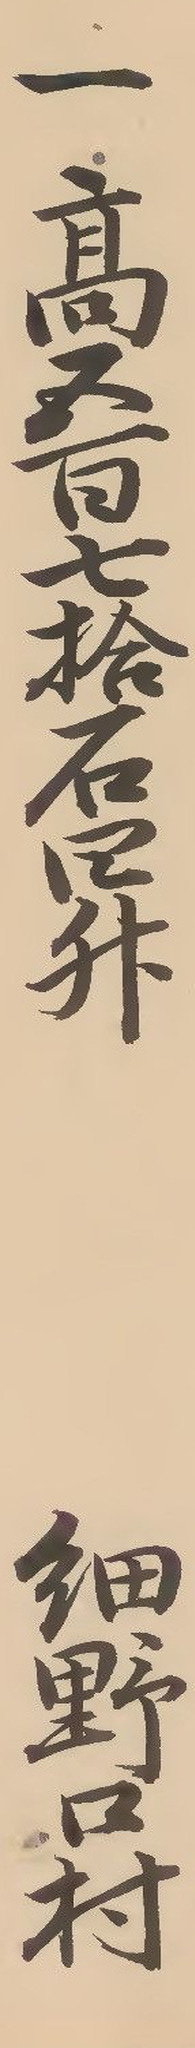一高五百七拾石四升細野口村

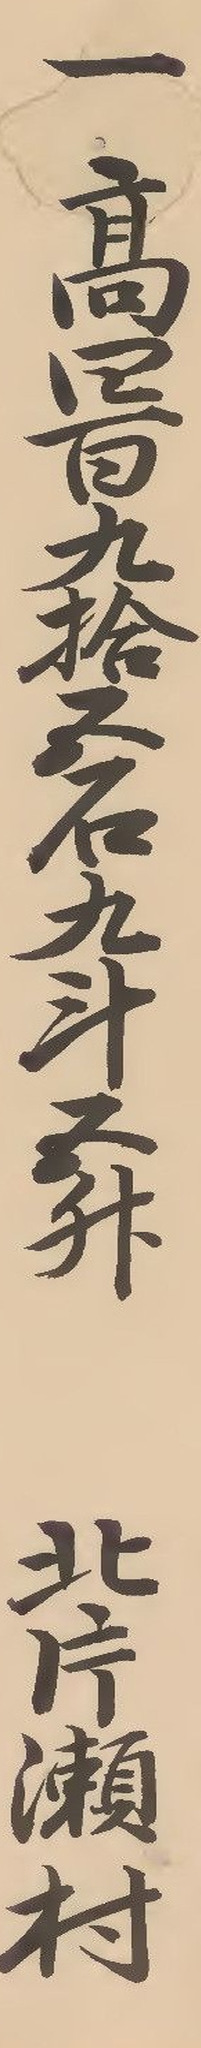一高四百九拾五石九斗五升北片瀬村
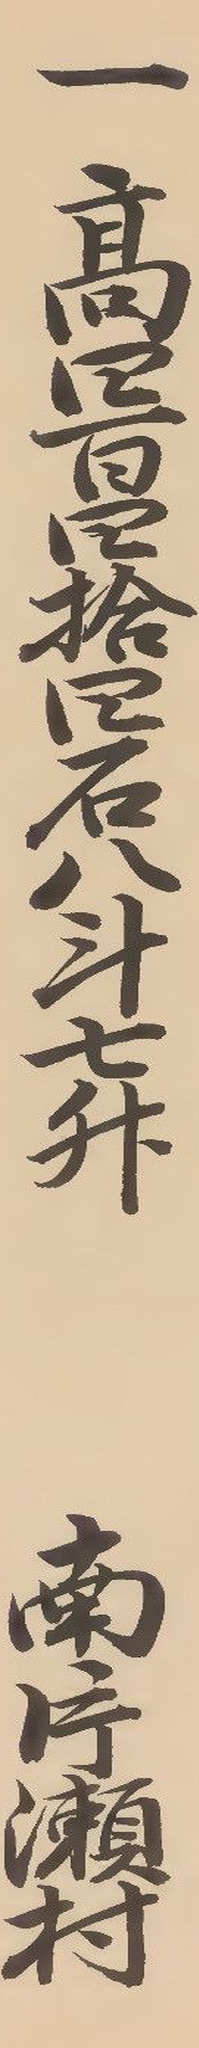一高四百四拾四石八斗七升南片瀬村
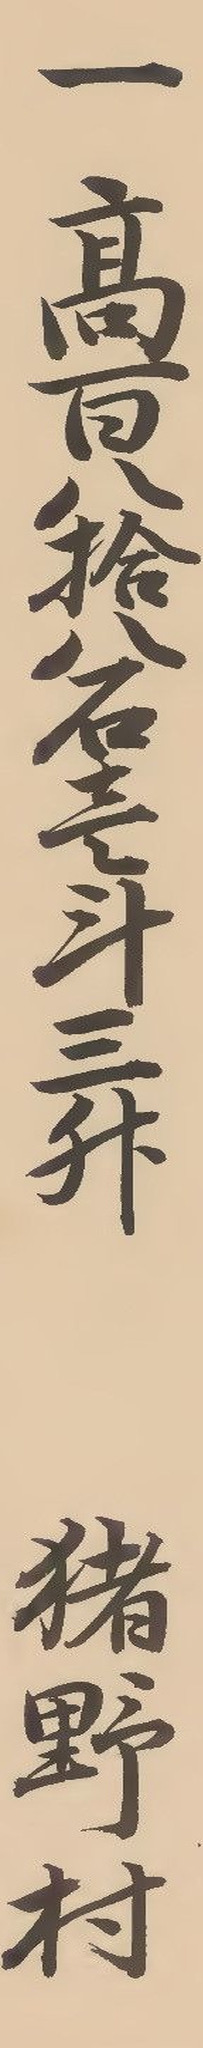一高百八拾八石壱斗三升猪野村
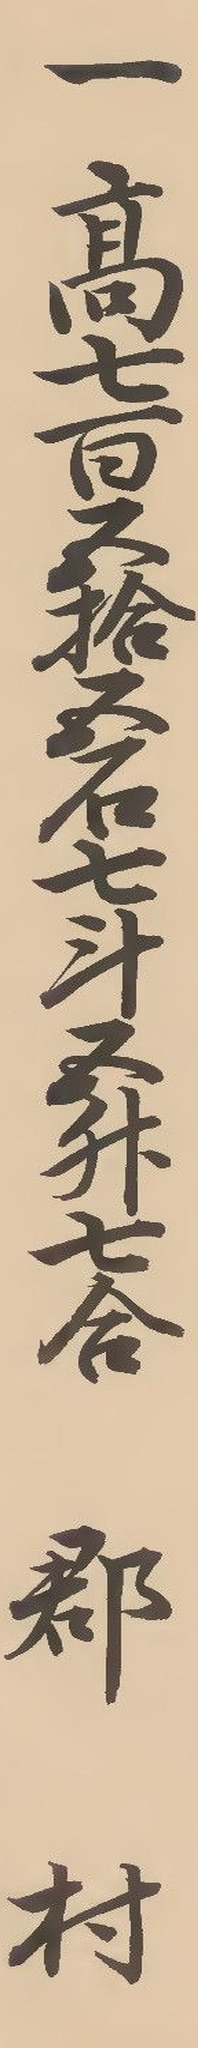一高七百五拾五石七斗五升七合郡村
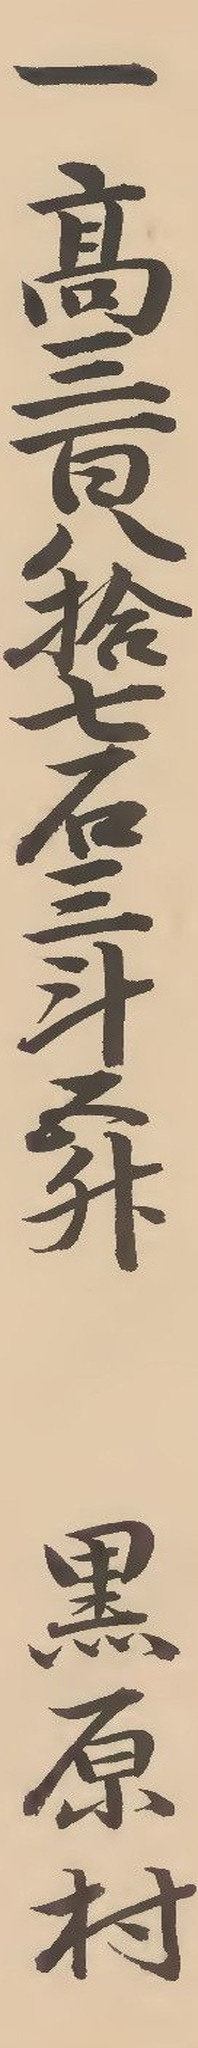一高三百八拾七石三斗五升黒原村
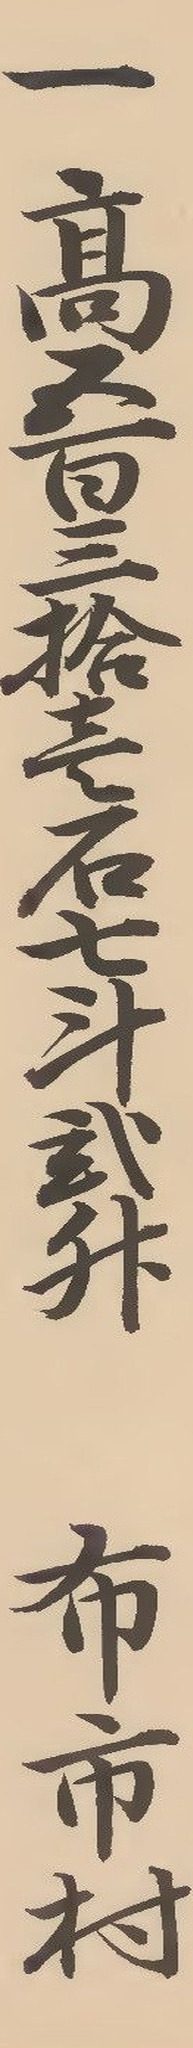一高五百三拾壱石七斗弐升布市村
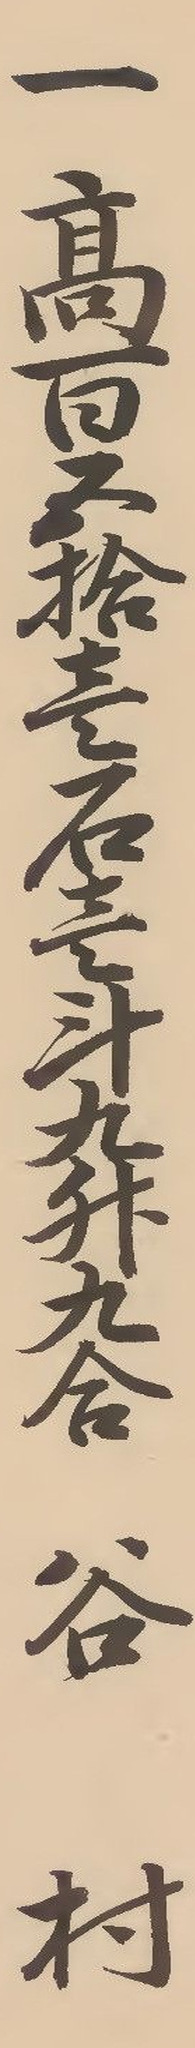一高百五拾壱石壱斗九升九合谷村
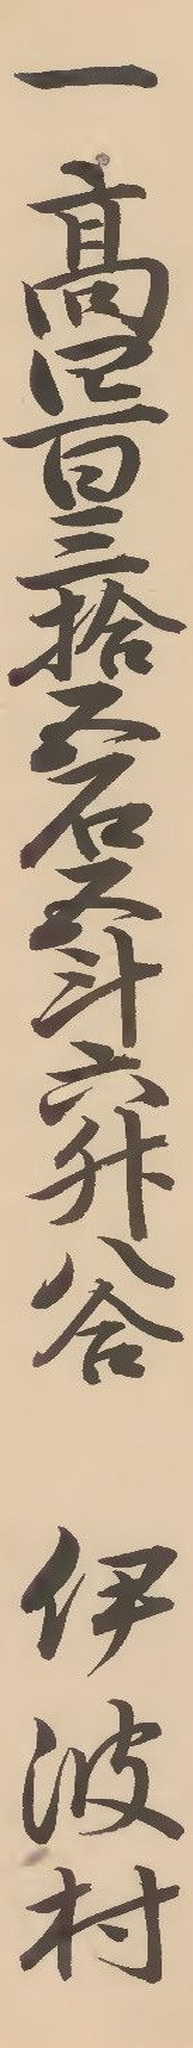一高四百三拾五石五斗六升八合伊波村

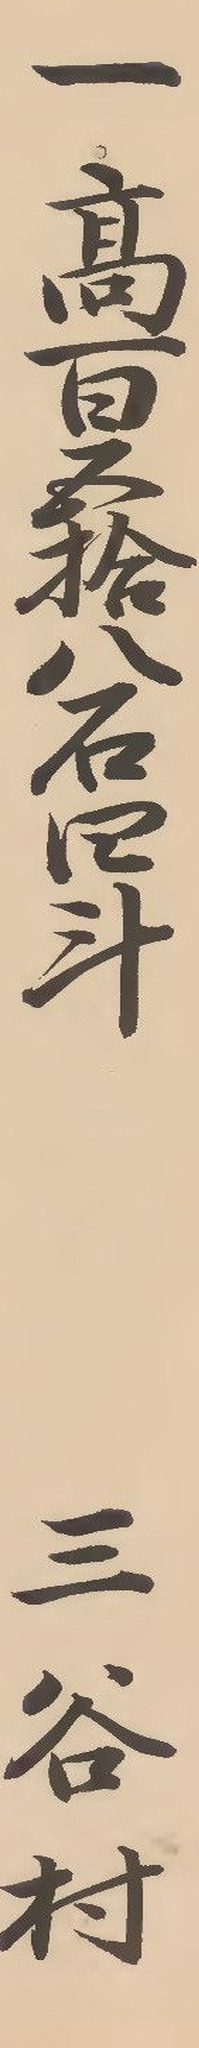一高百五拾八石四斗三谷村
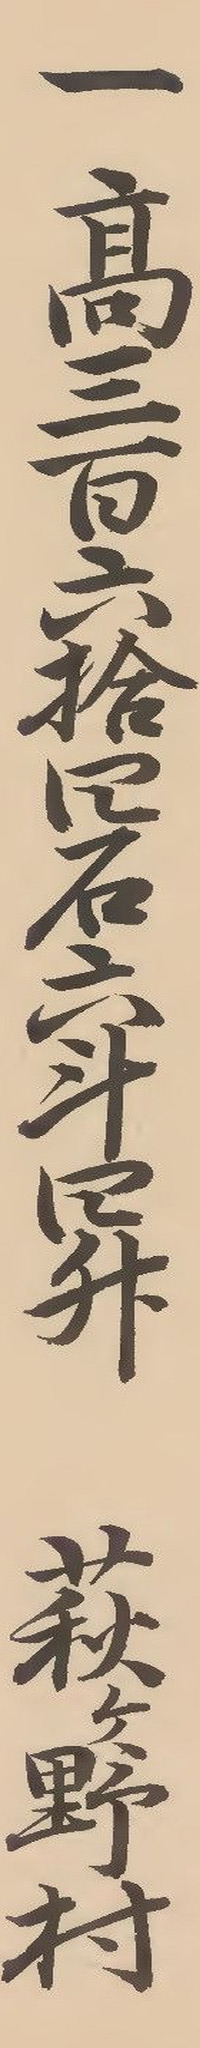一高三百六拾四石六斗四升萩ヶ野村
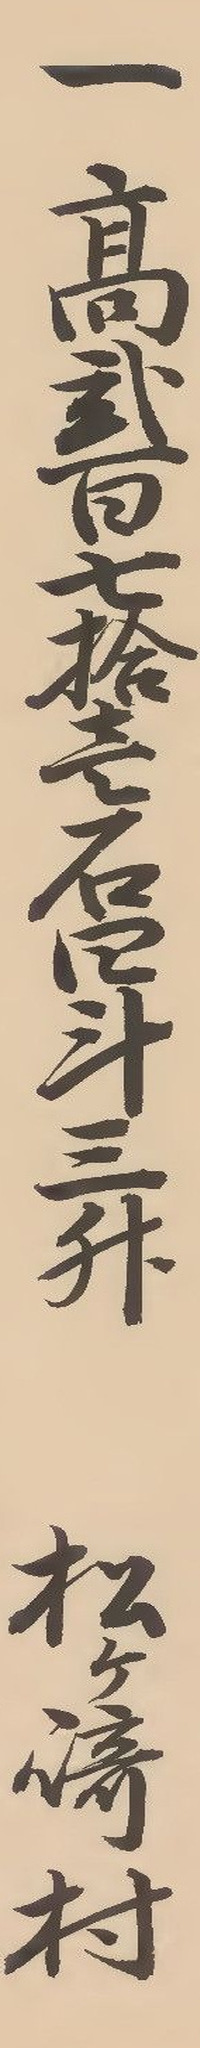一高弐百七拾壱石四斗三升松ヶ崎村
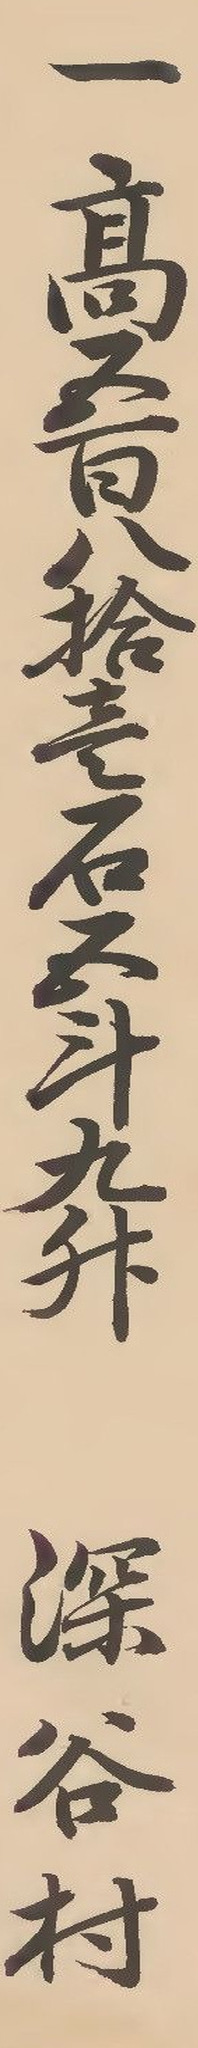一高五百八拾壱石五斗九升深谷村
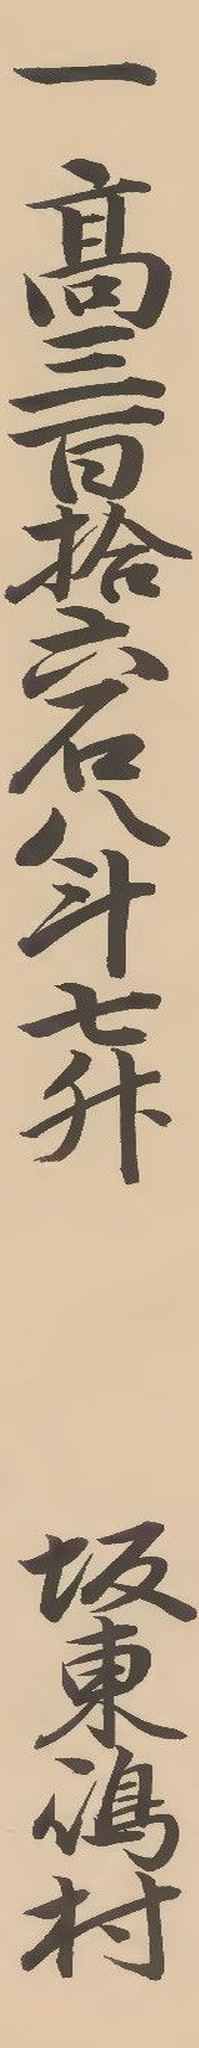一高三百拾六石八斗七升坂東島村
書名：越前国郷帳
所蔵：国立公文書館 National Archives of Japan
